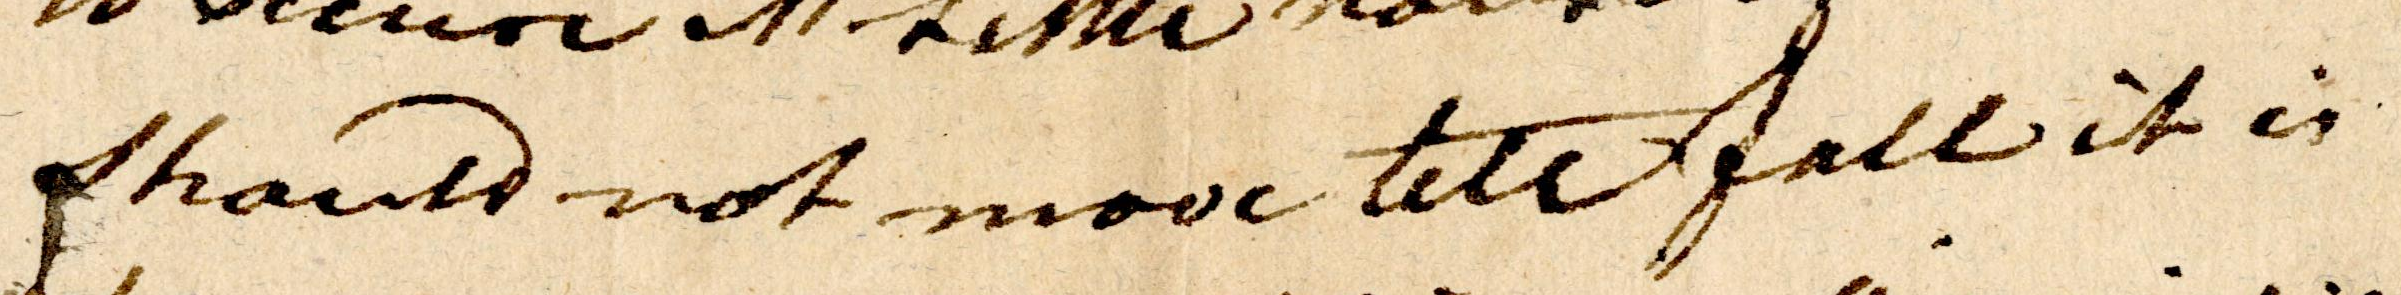should not move till fall it is
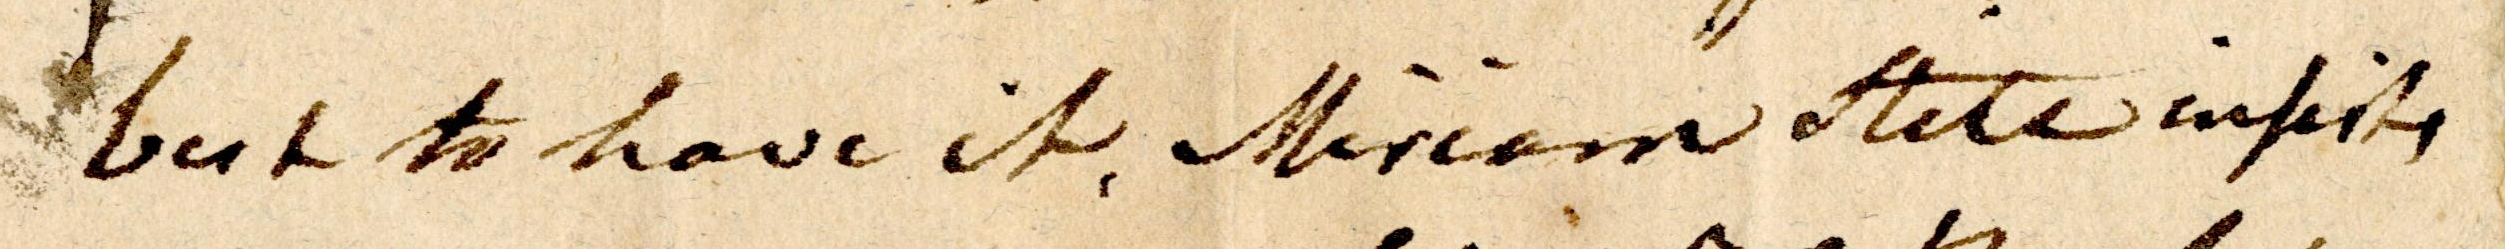best to have it, Miriam still insists
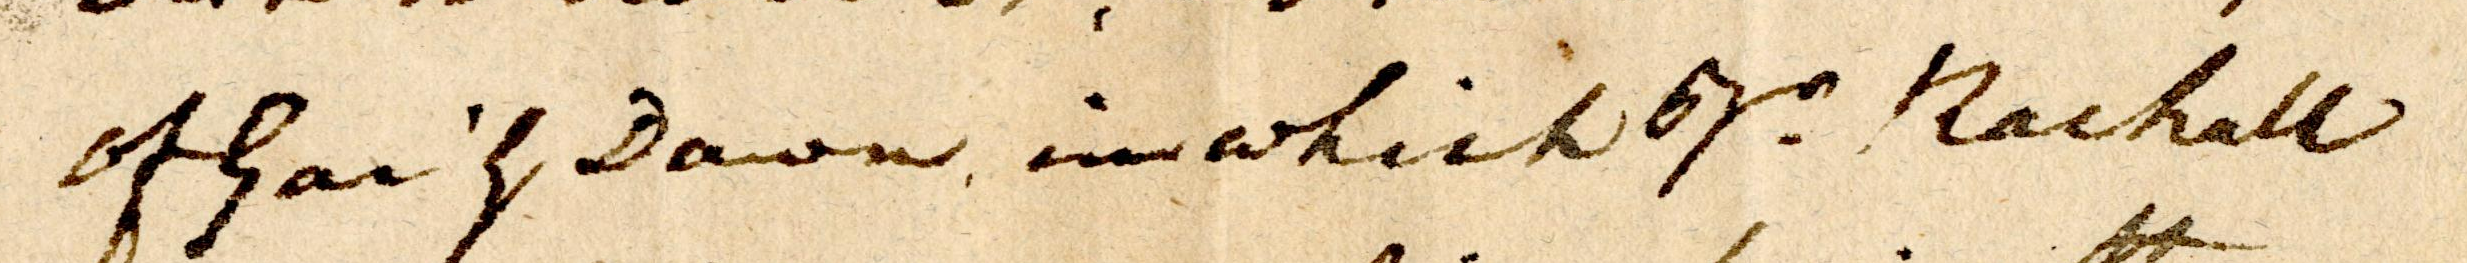of Going Down in which y^r. Rachall
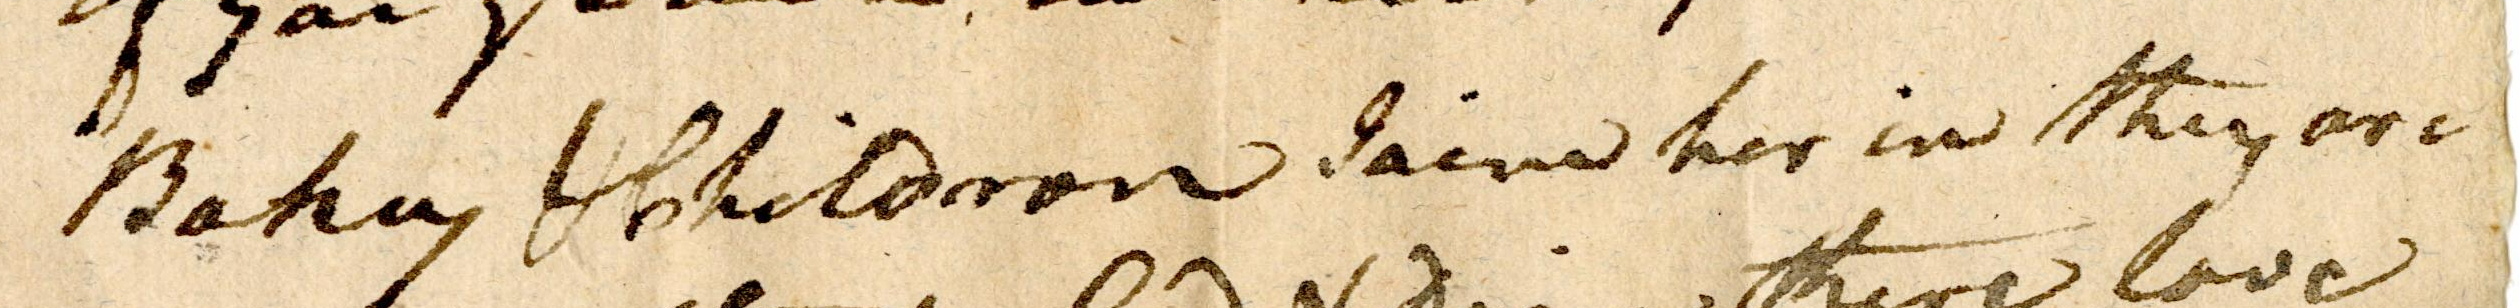Bakey & children joind her in they are
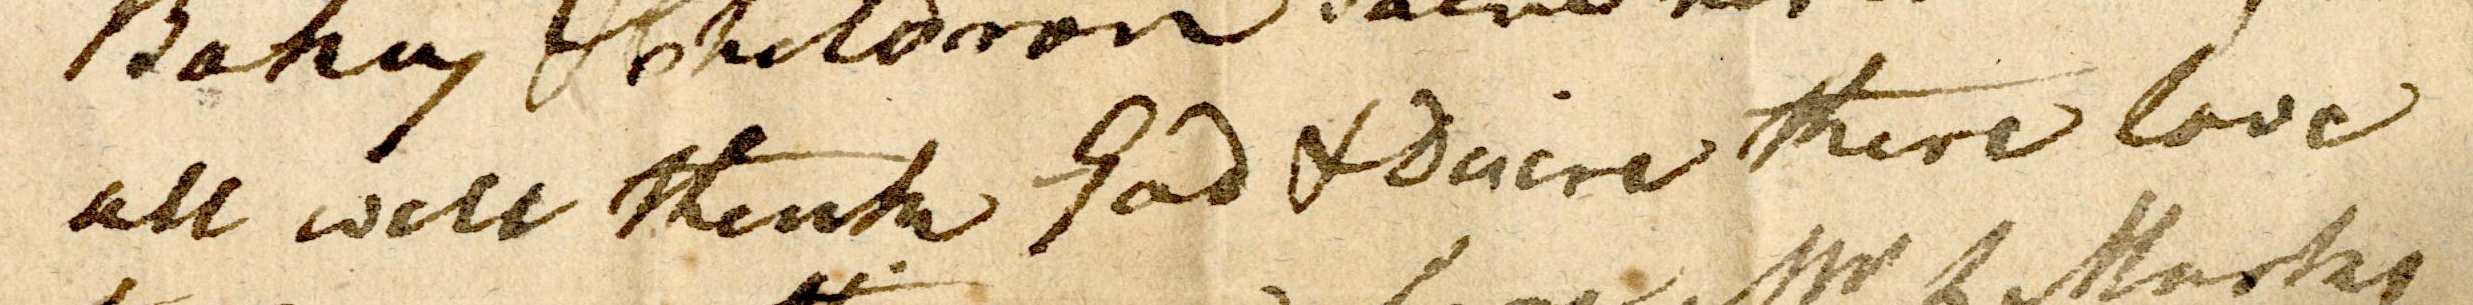all well thank God & desire there love
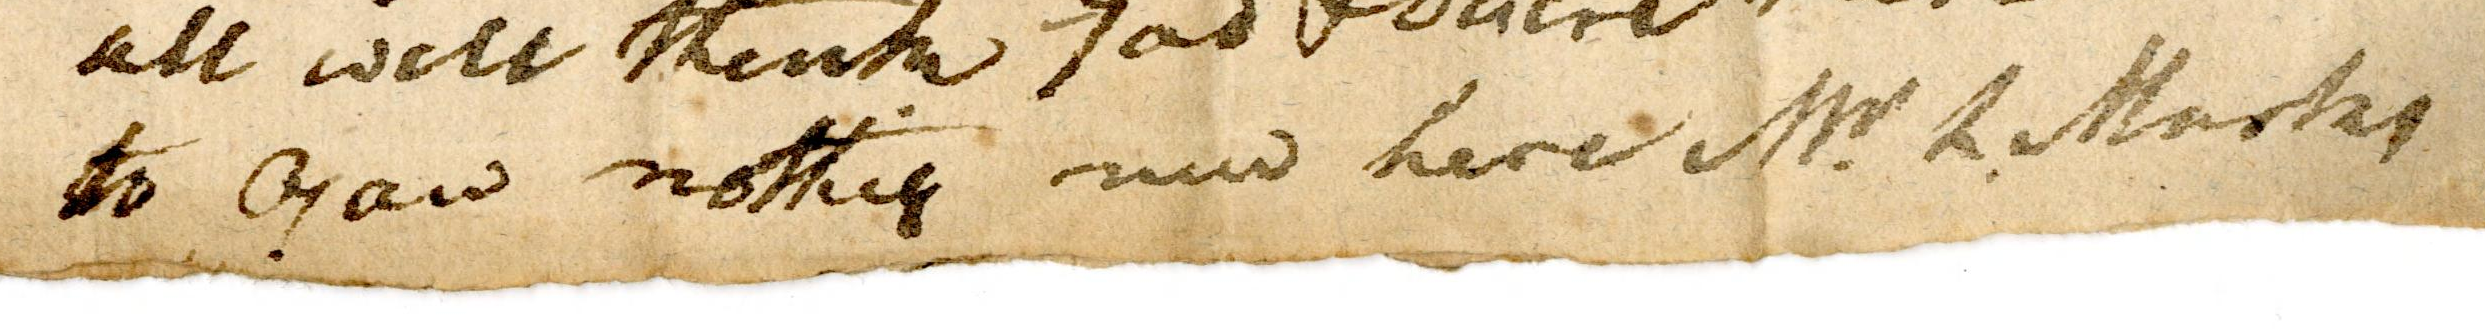to you nothing new here M^r L Marks
